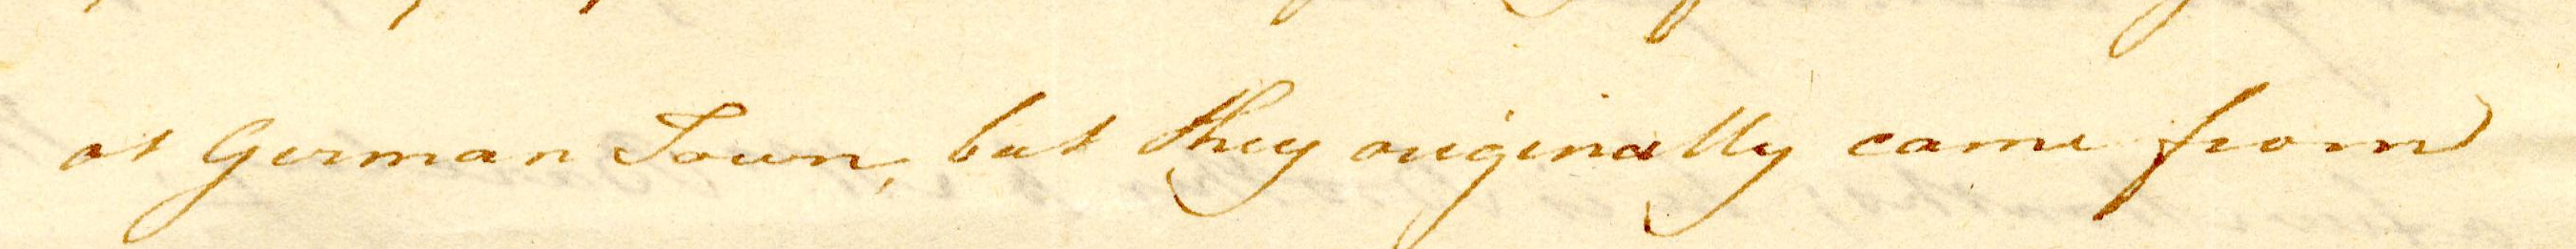at German Town, but they originally came from
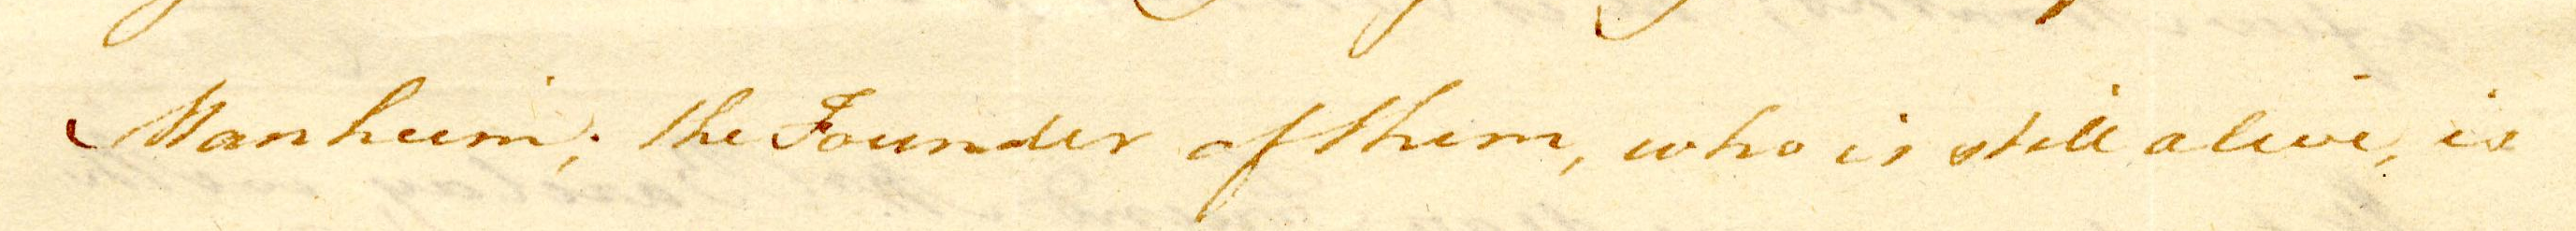Manheim; the Founder of them, who is still alive, is
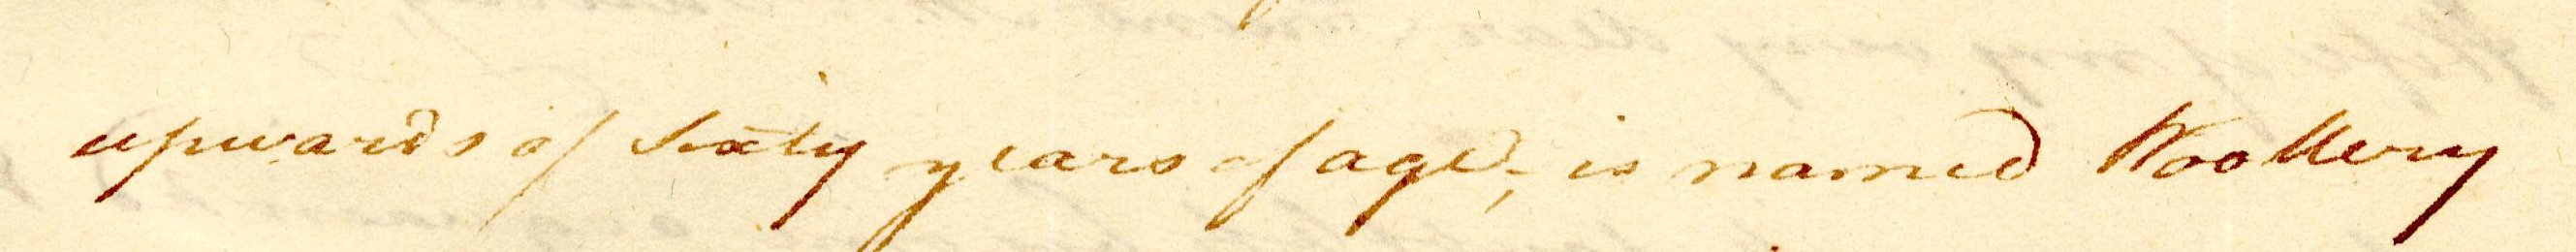upwards of sixty years of age, is named Wollery
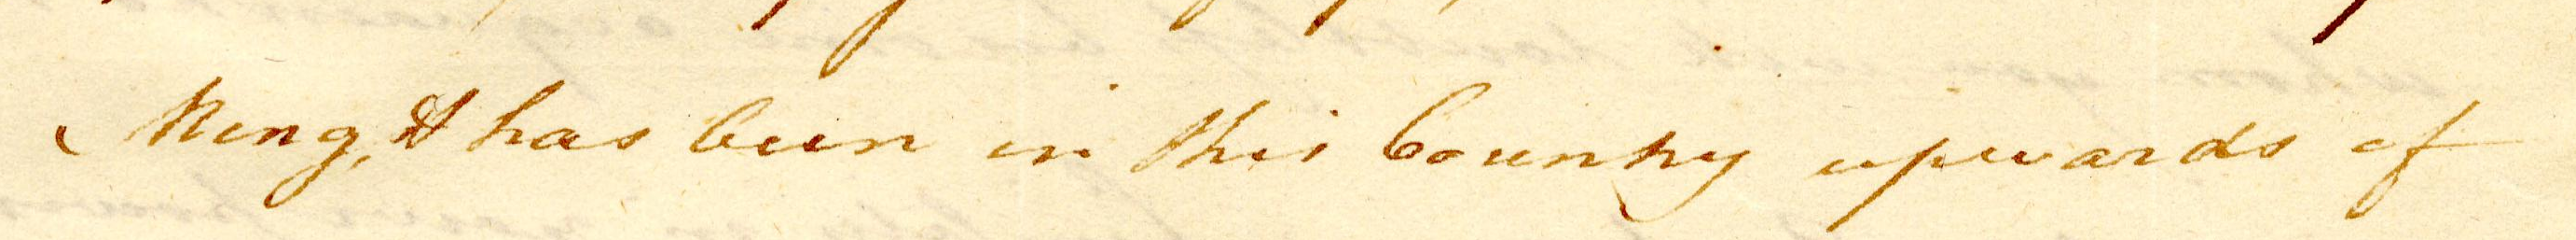Mengs, & has been in this Country upwards of
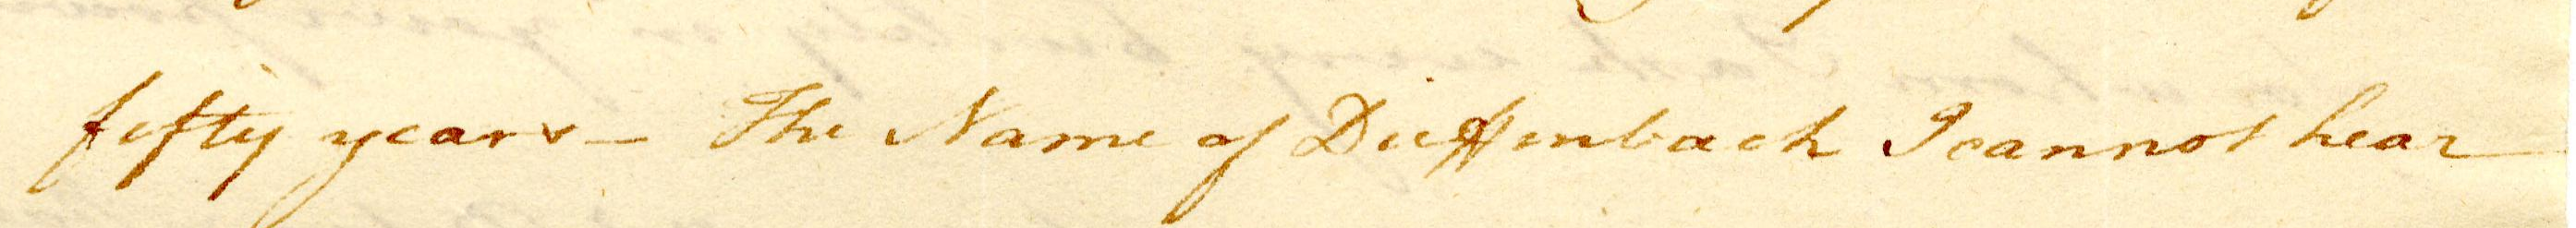fifty years- The Name of Dieffenbach I cannot hear
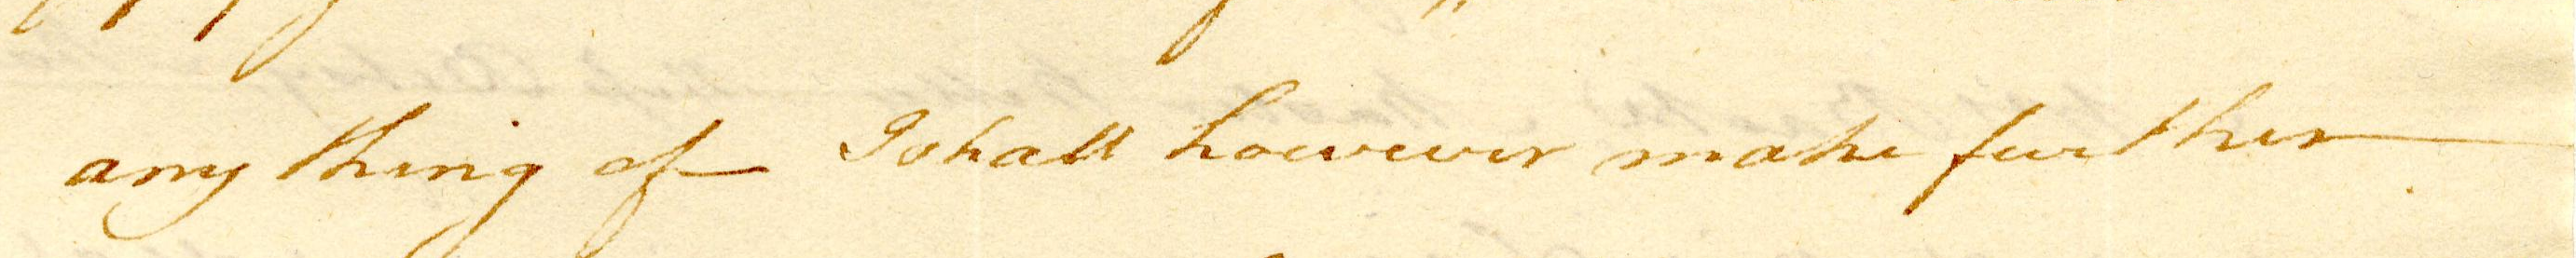anything of- I shall however make further
